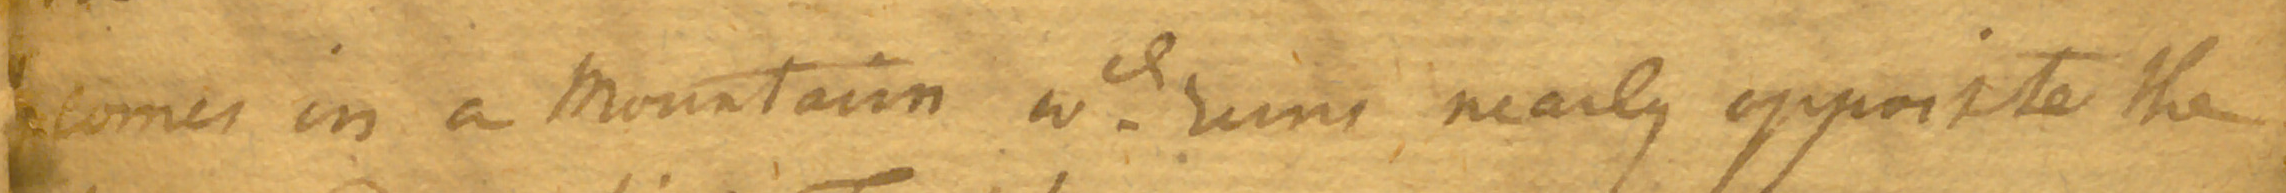comes in a mountain w^ch. runs nearly opposite the
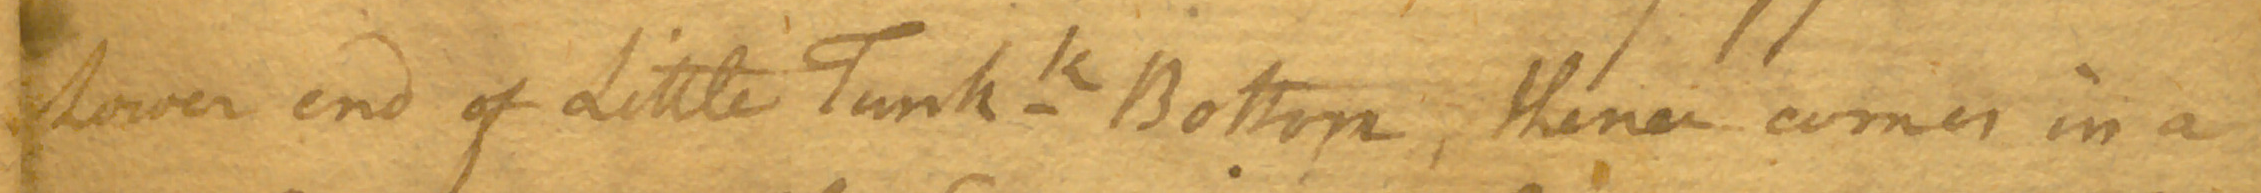Lower end of Little Tunk^k Bottom, thence comes in a
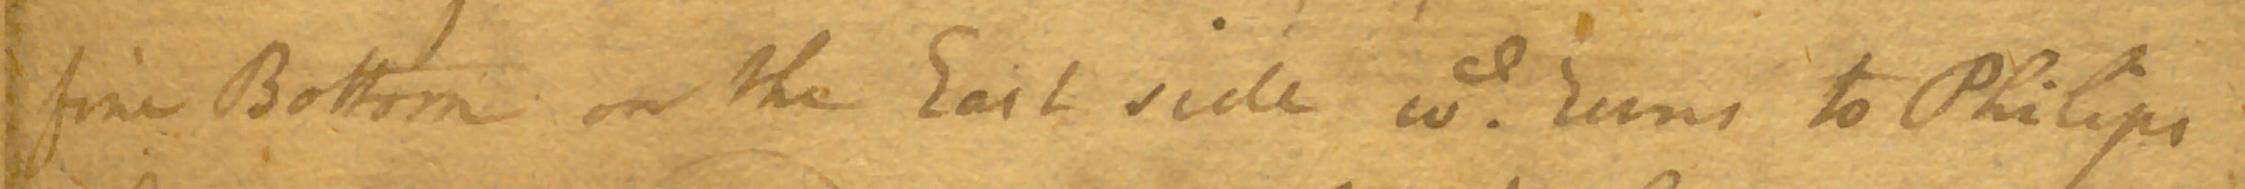fine Bottom on the East side w^ch. runs to Philips
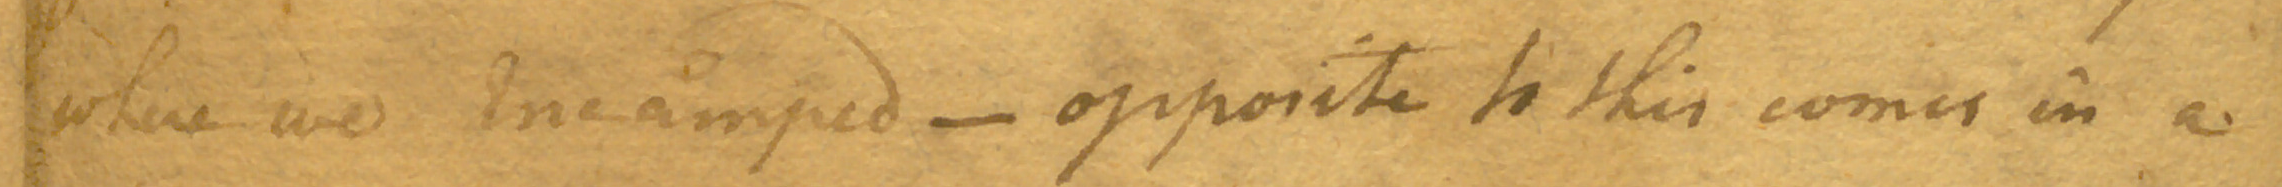where we Encamped- opposite to this comes in a
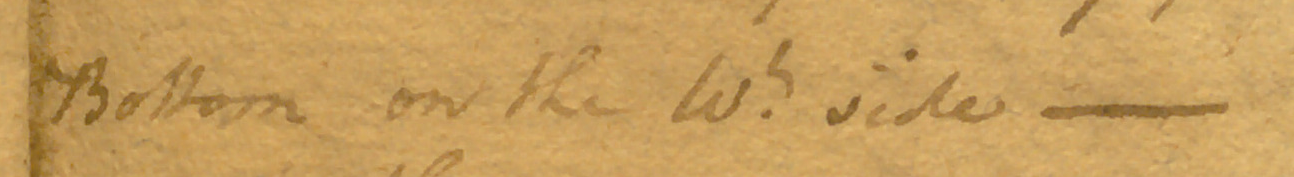Bottom on the W^t. side-
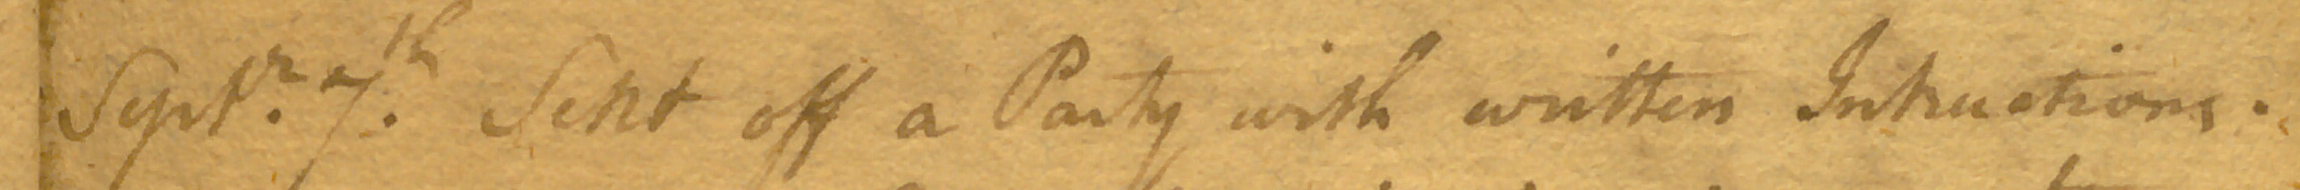Sept^r. 7^th. Sent off a Party with written Intructions.
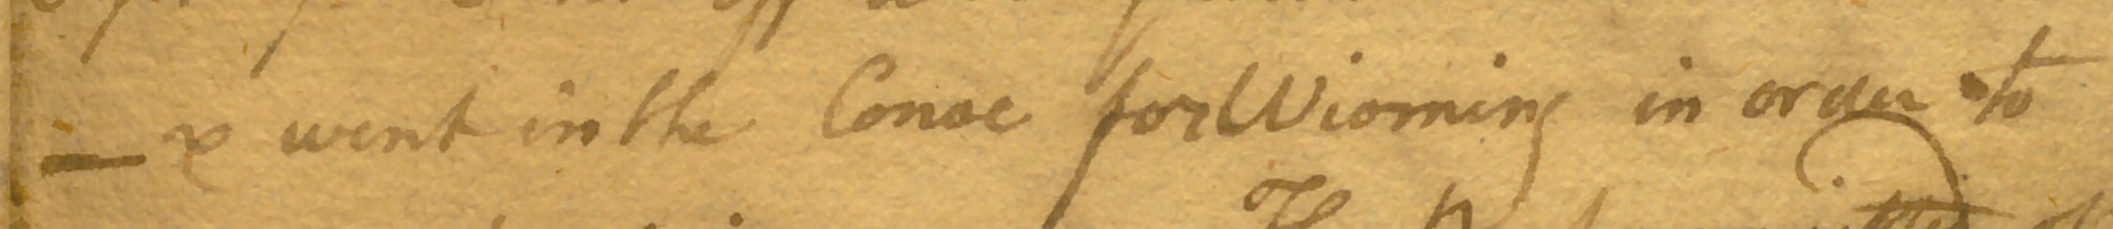-& went in the Conoe for Wioming in order to
